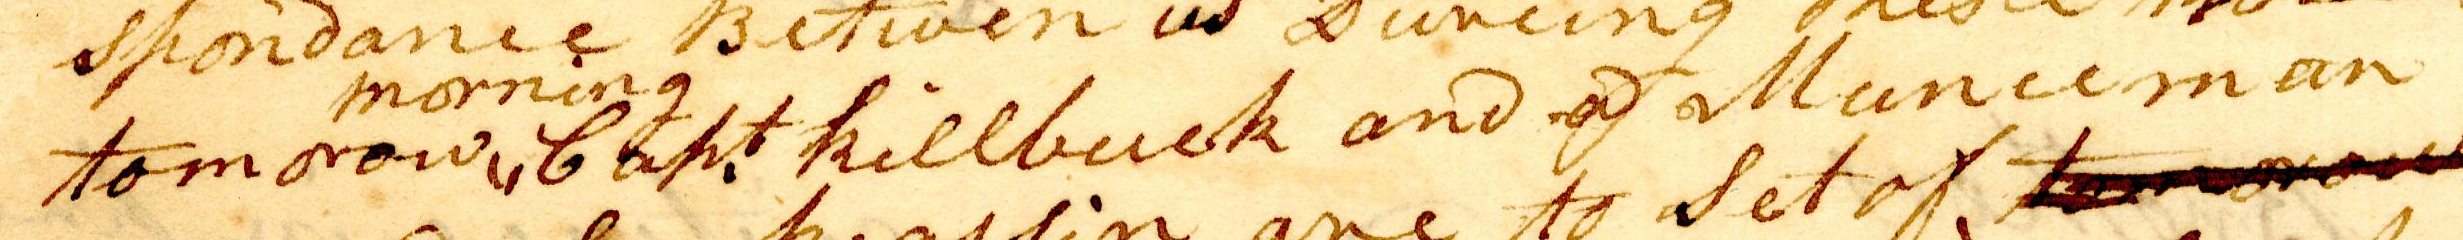tomorow, Cap^t Killbuck and a Munce man
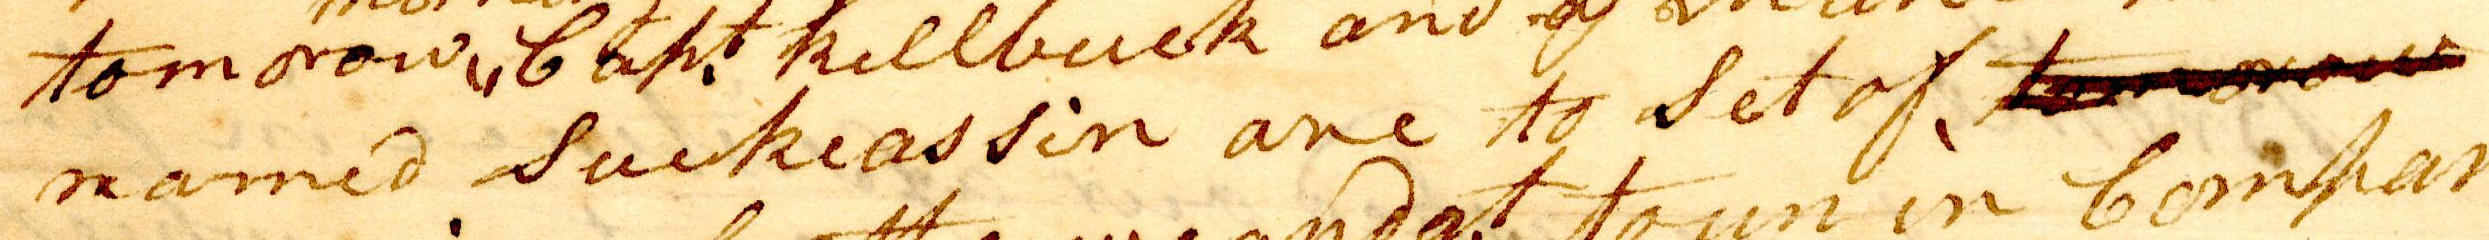named Suckeassin are to set of [tomorrow]
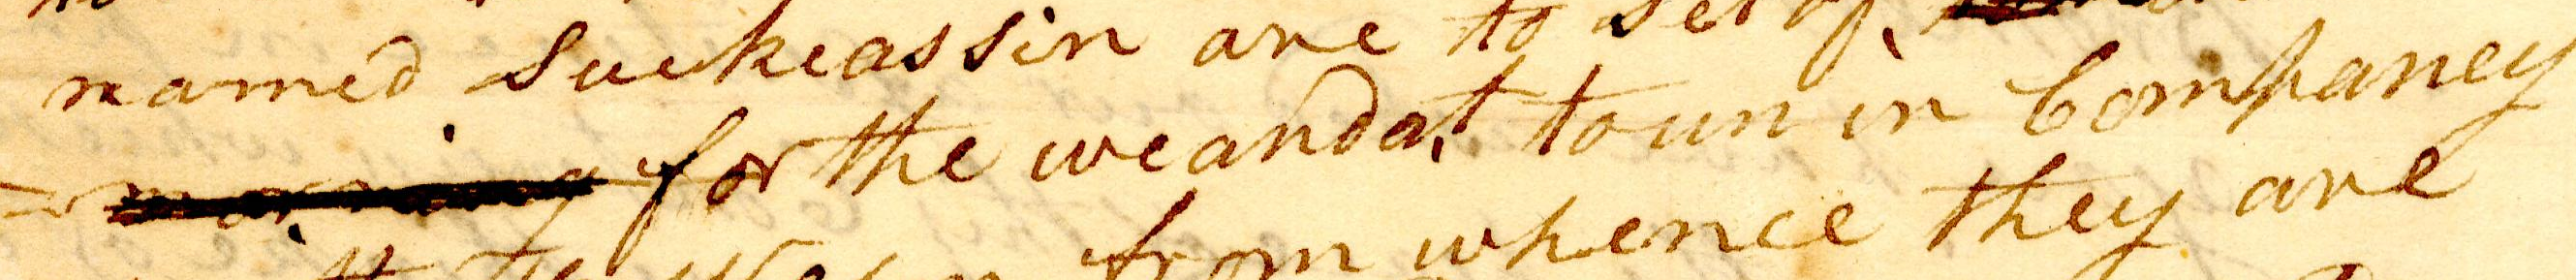[morning] for the weandat toun in Companey
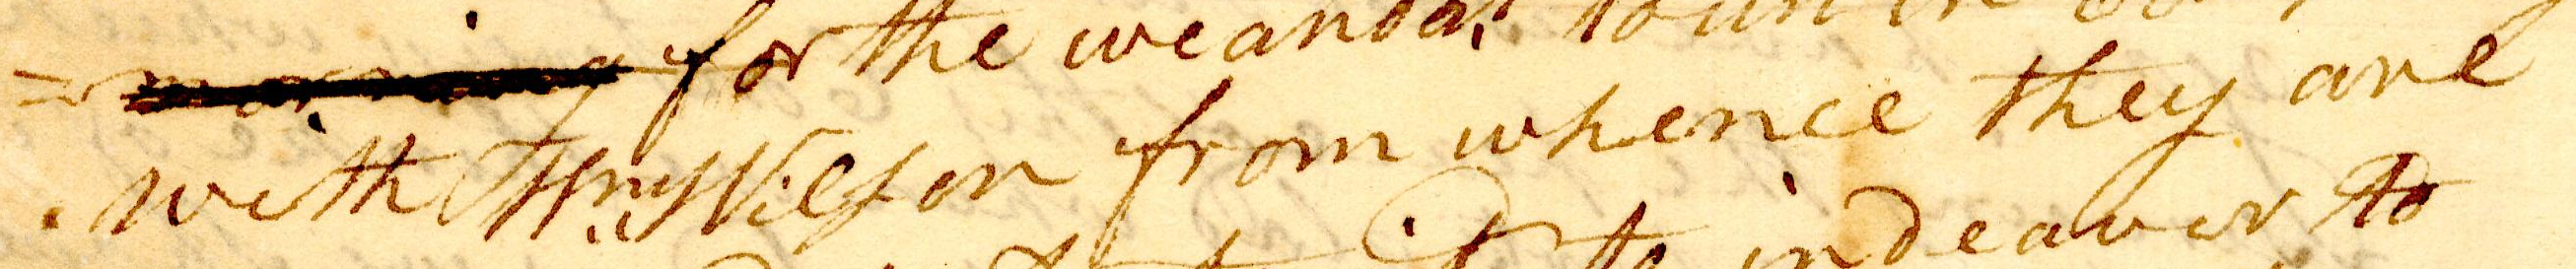with W^m Wilson from whence they are
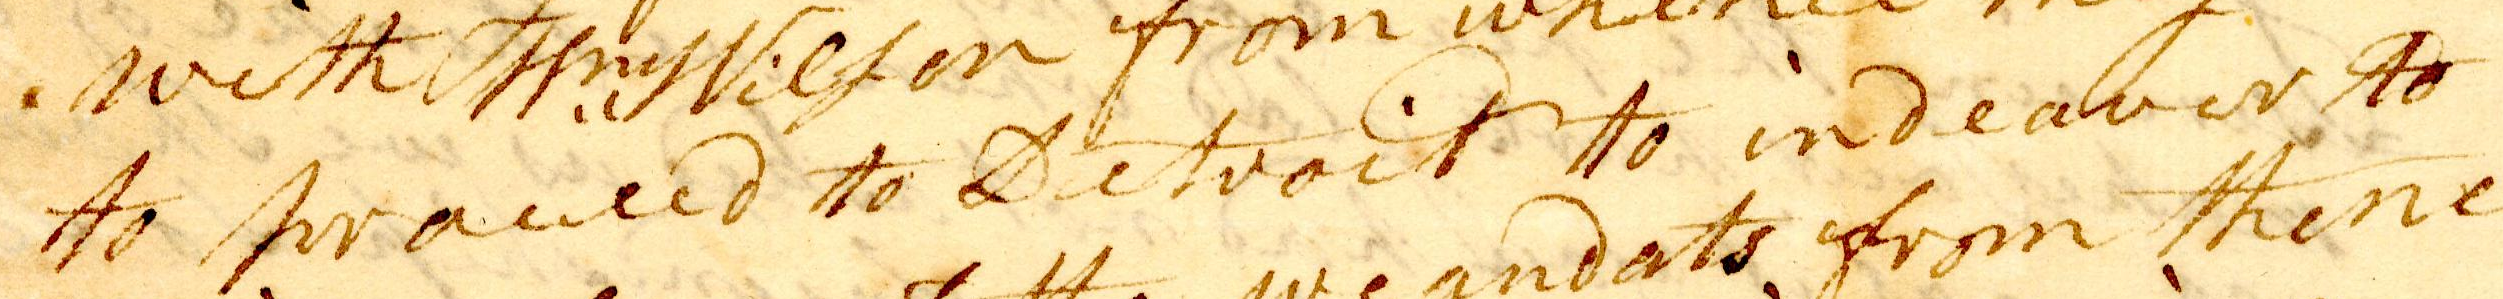to proceed to Detroit to indeaver to
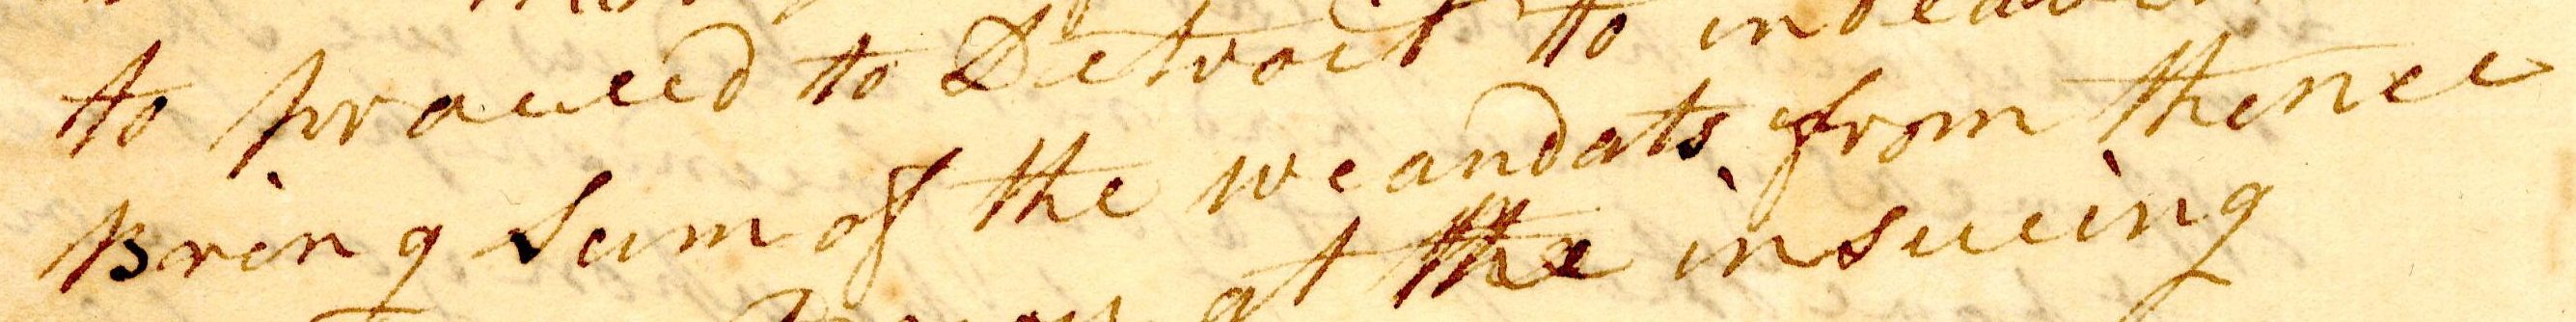Bring Sum of the weandats from thence
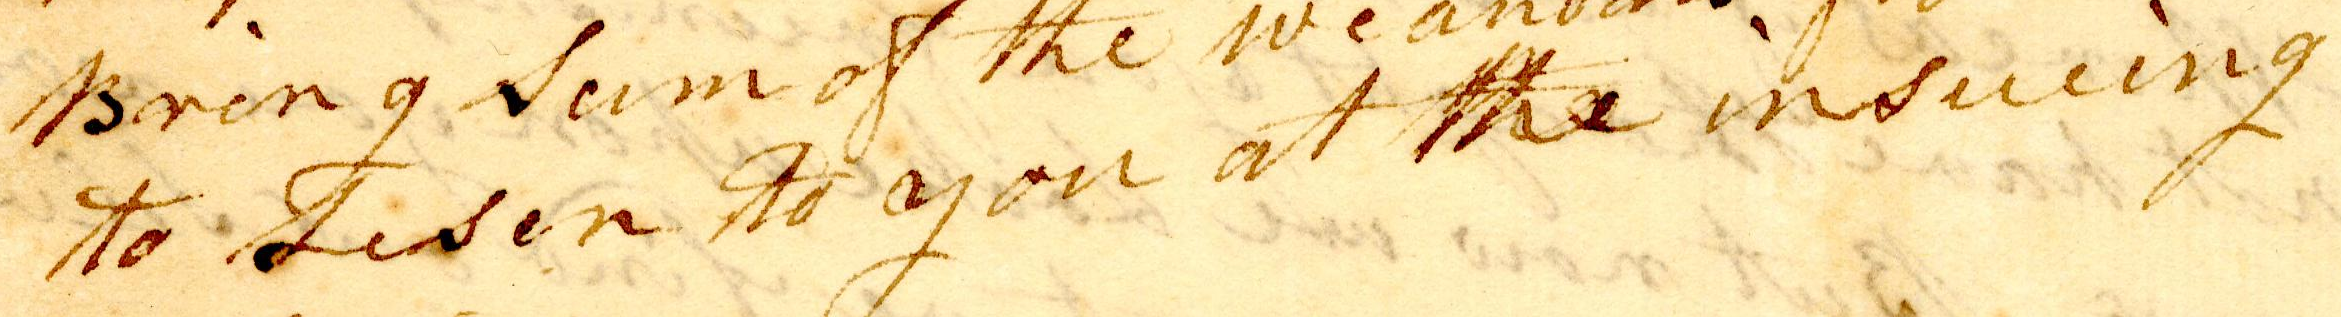to Lisen to you at the insueing
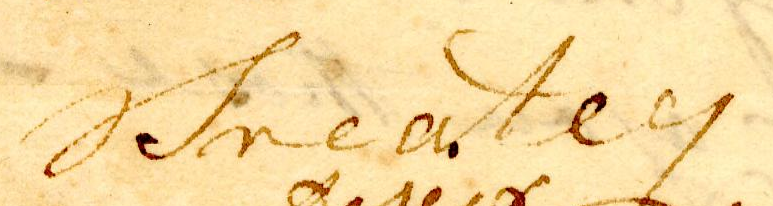Treatey
